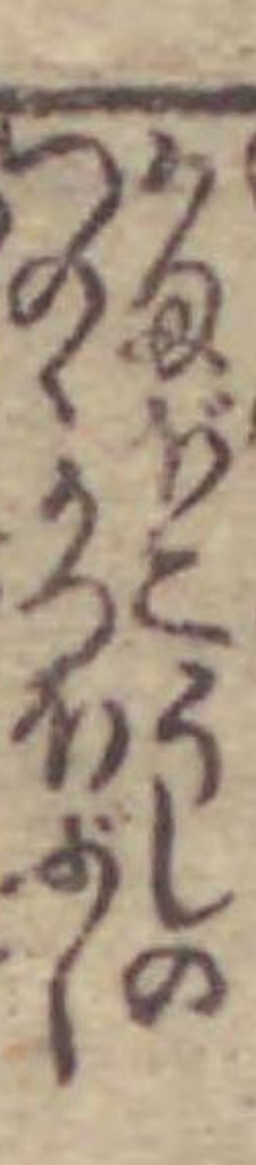つのゝかつほぶし
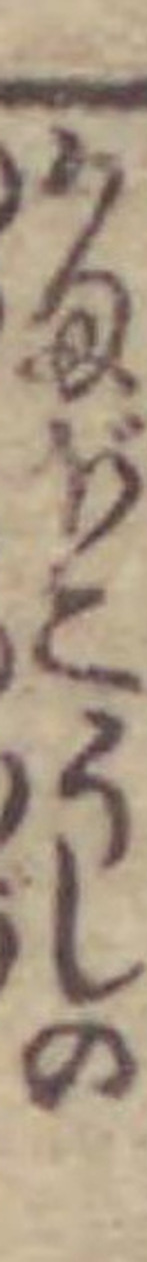かまぼこうしの
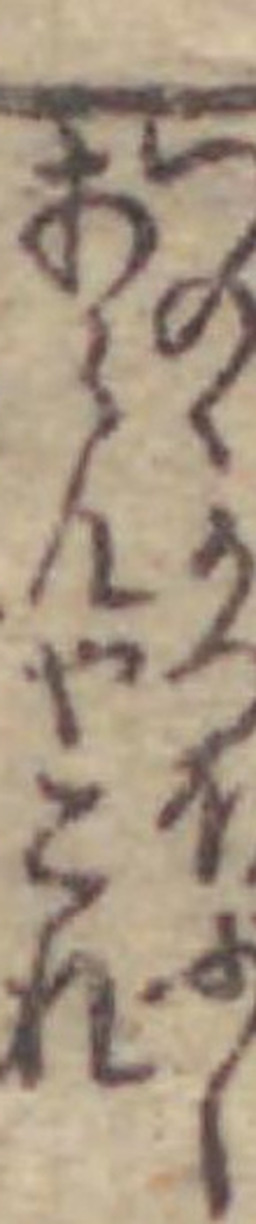あらんやこれ
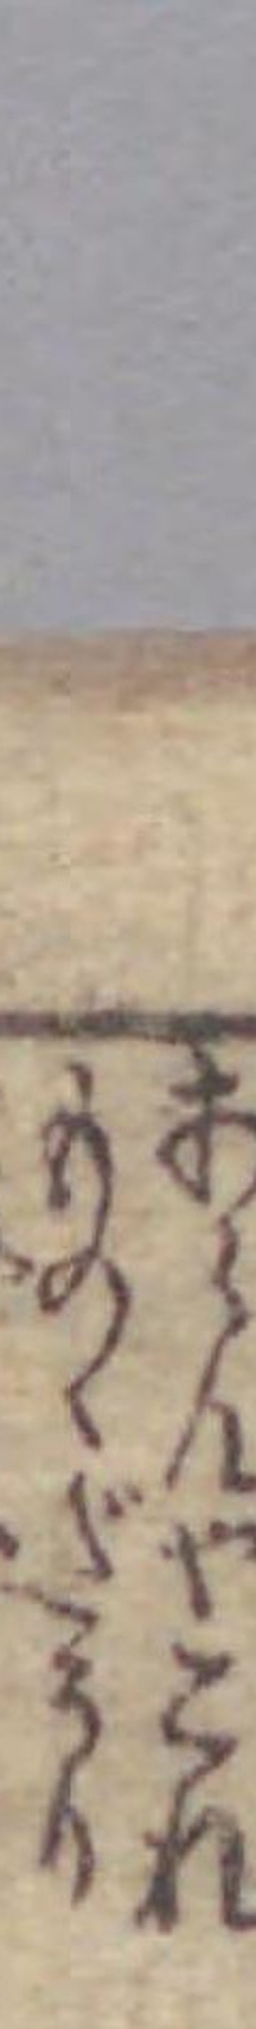ものゝだうり
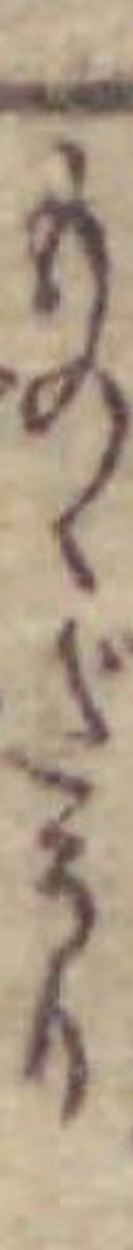ものゝだうり
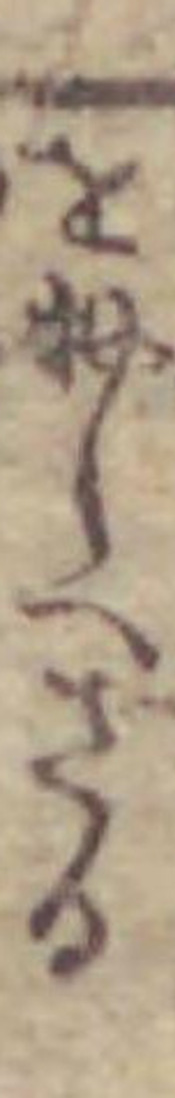をおしへざる
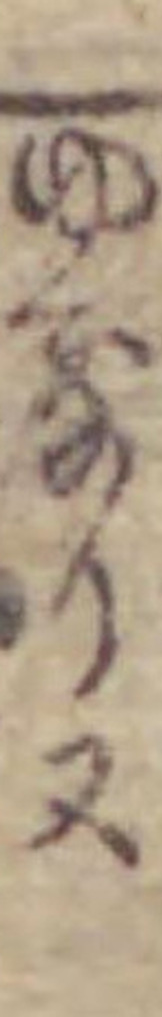ゆへなり又
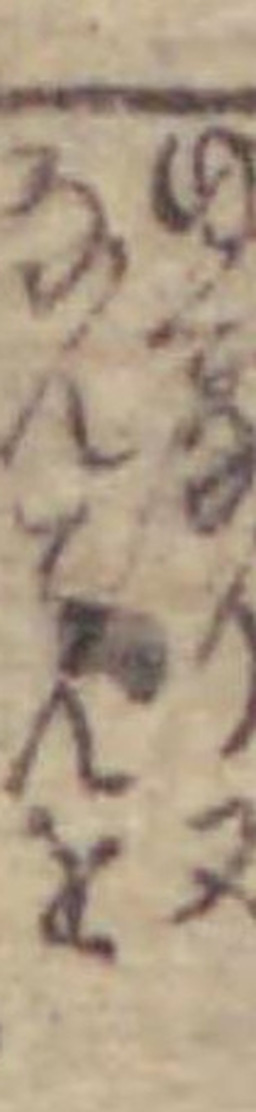なんてんを
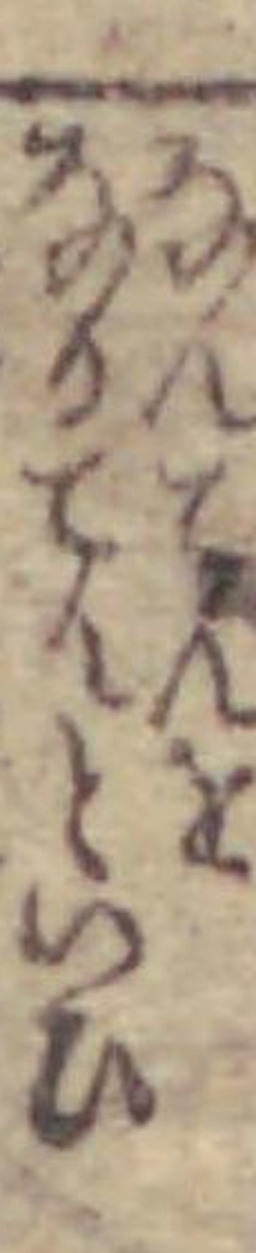なるてんといひ
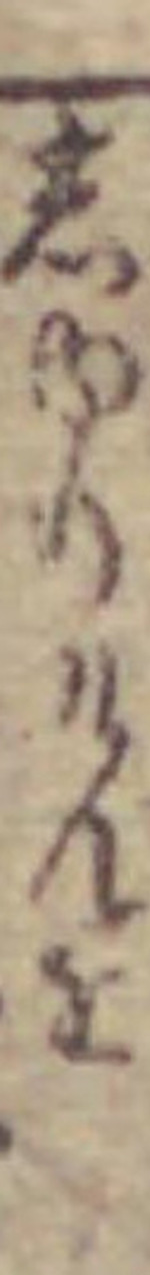しゆりけんを
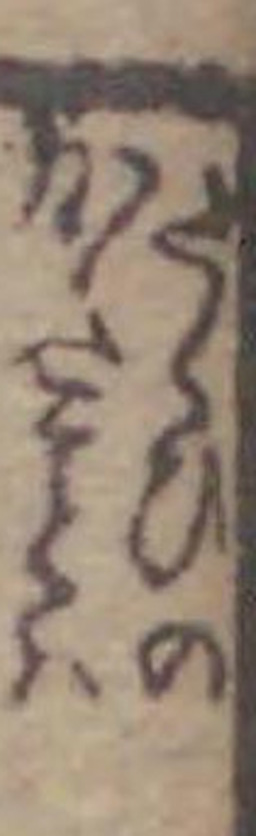かたことは
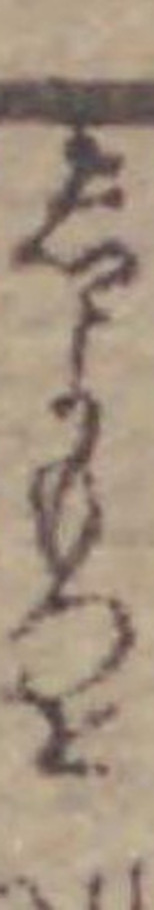しよもつを
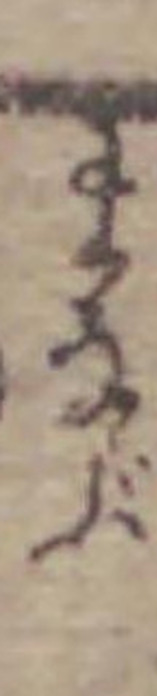まなぶ
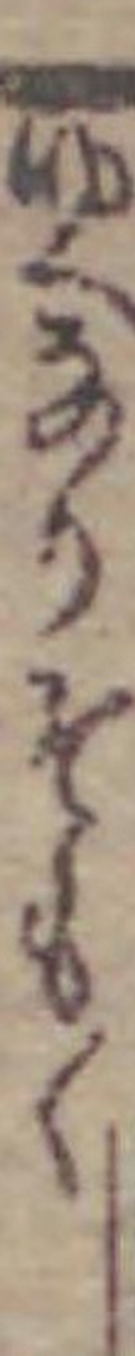ゆへなりそも〳〵
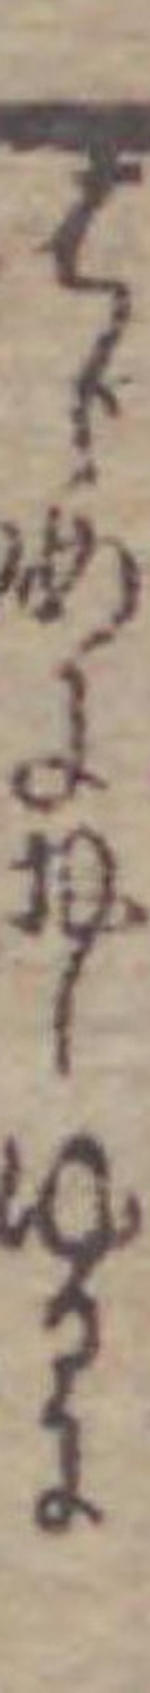はじめにおしゆるに
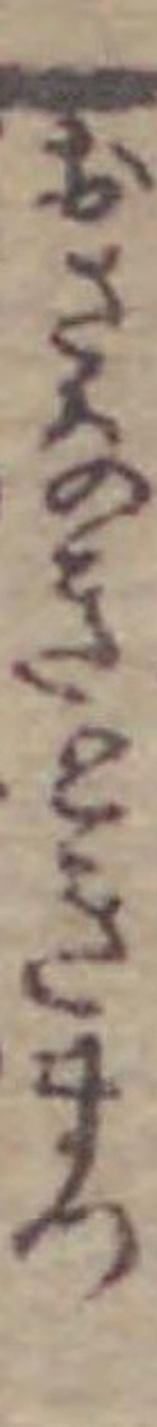おさなきときまつ
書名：和荘兵衛後日話 : 3巻
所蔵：国立国会図書館 National Diet Library, JAPAN
